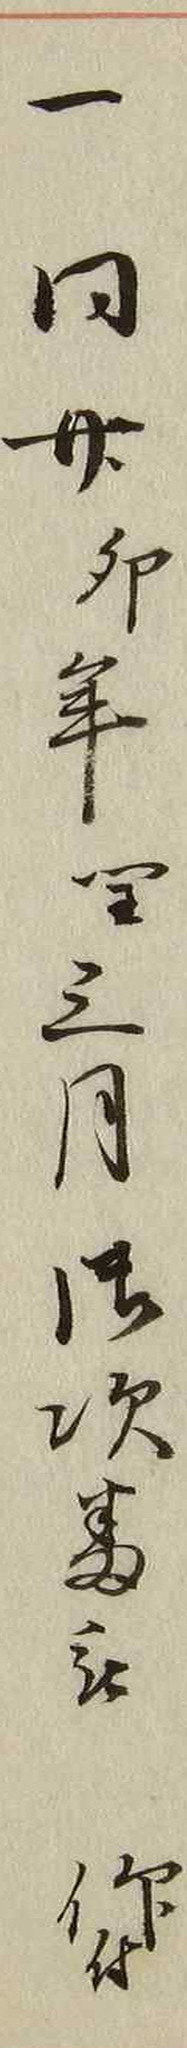一同廿卯年閏三月御次番被仰付
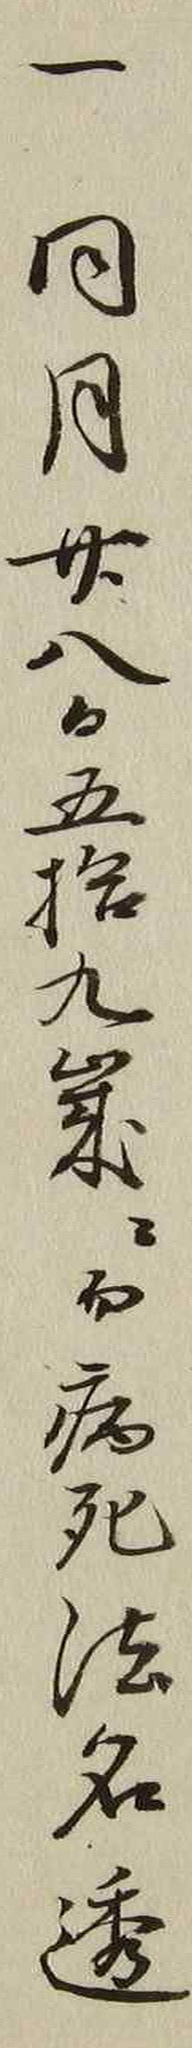一同月廿八日五拾九歳ニ而病死法名透
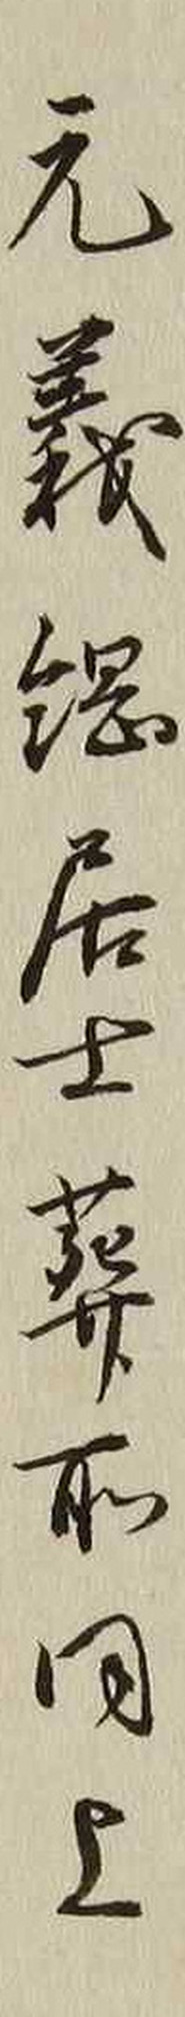元義綱居士葬所同上
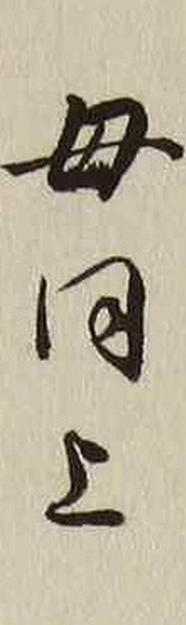母同上
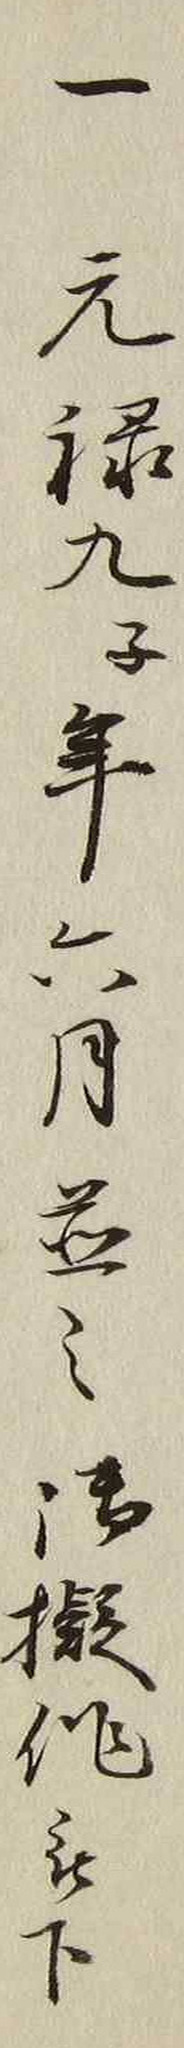一元禄九子年六月並之御擬作被下
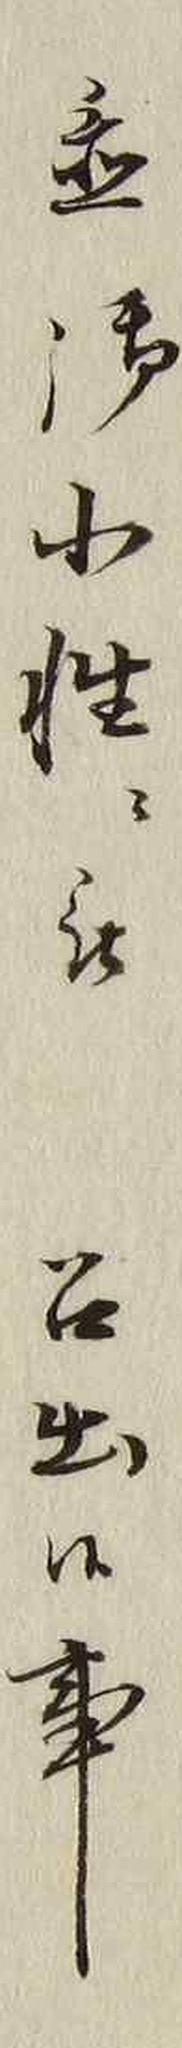置御小性ニ被召出候事
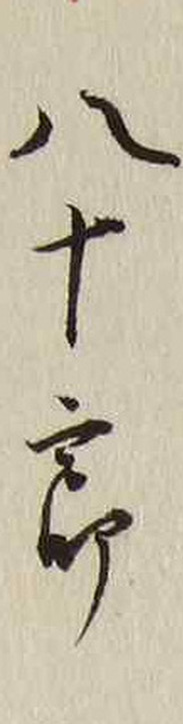八十郎
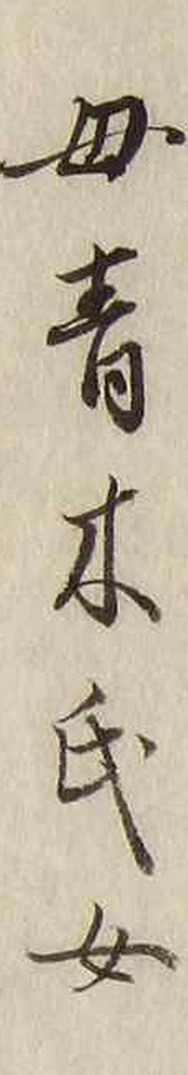母青木氏女

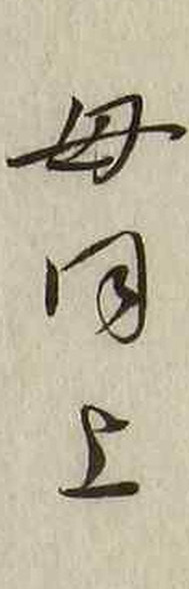母同上
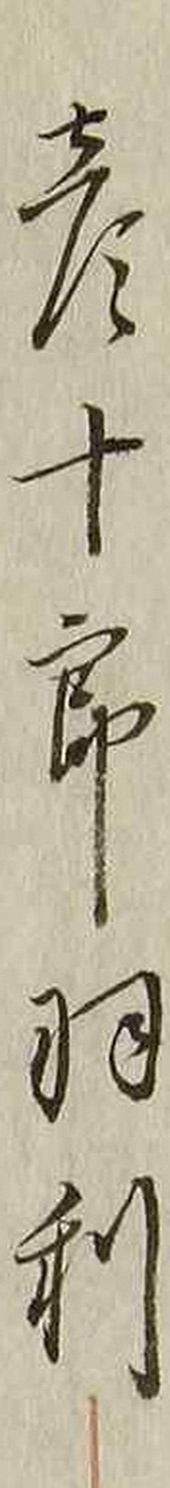彦十郎羽利
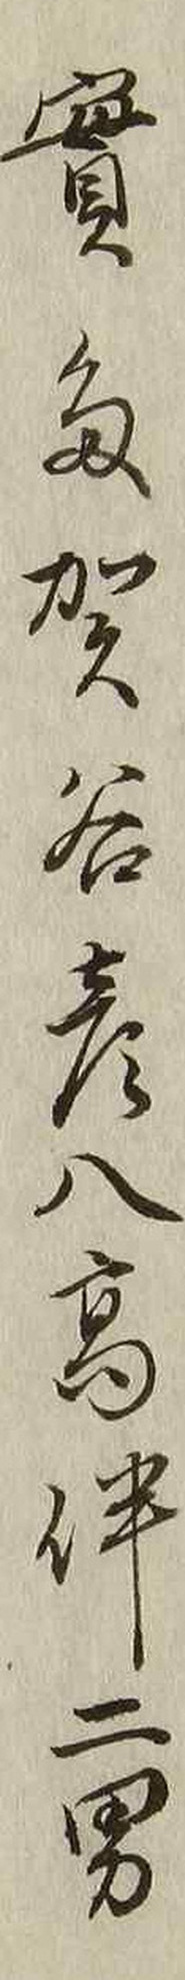実多賀谷彦八高伴二男
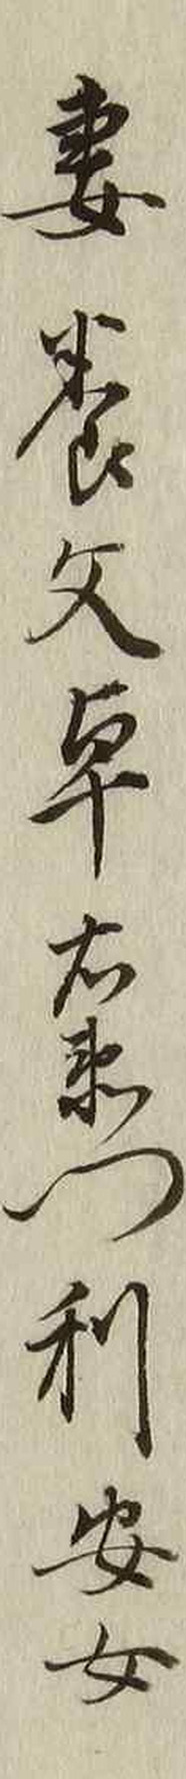妻養父卓右衛門利安女
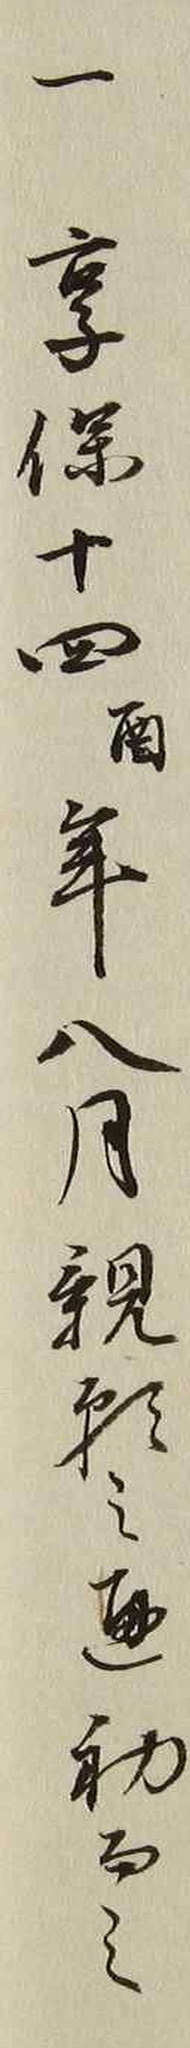一享保十四酉年八月親願之通初而之
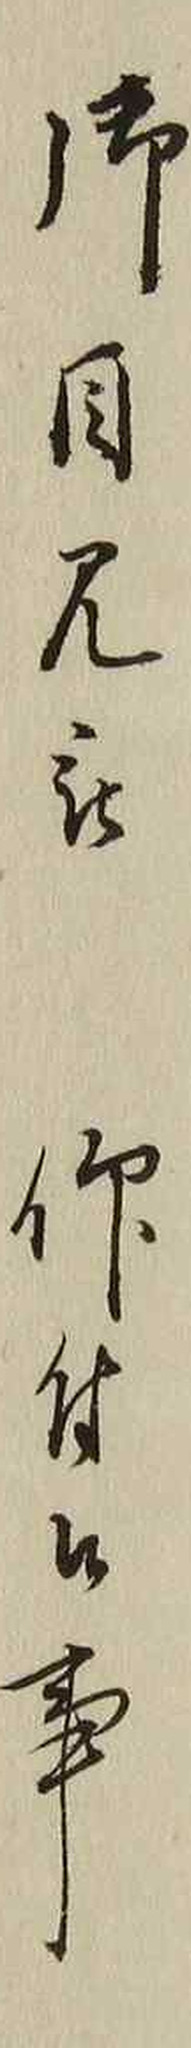御目見被仰付候事
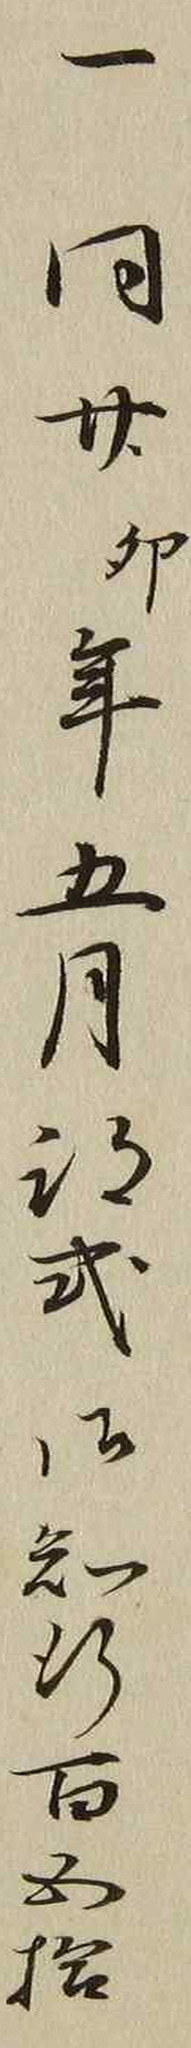一同廿卯年五月跡式御知行百五拾
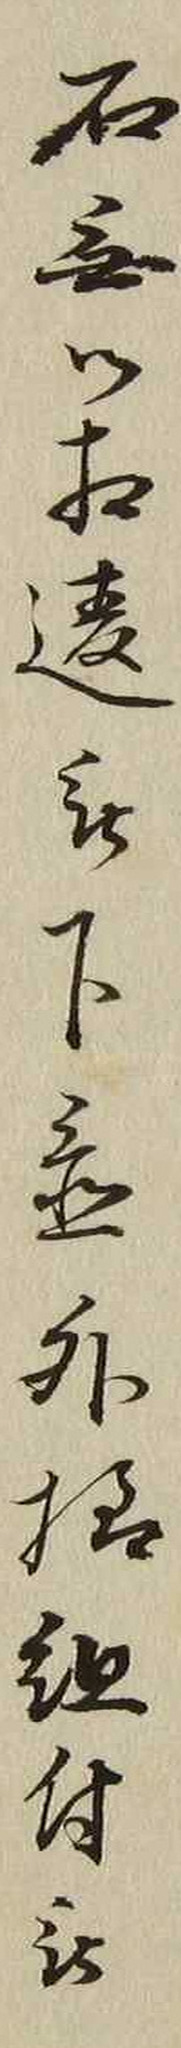石無御相違被下置外様組付被
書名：諸士系譜　巻之22　い之部22
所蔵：会津若松市立会津図書館
